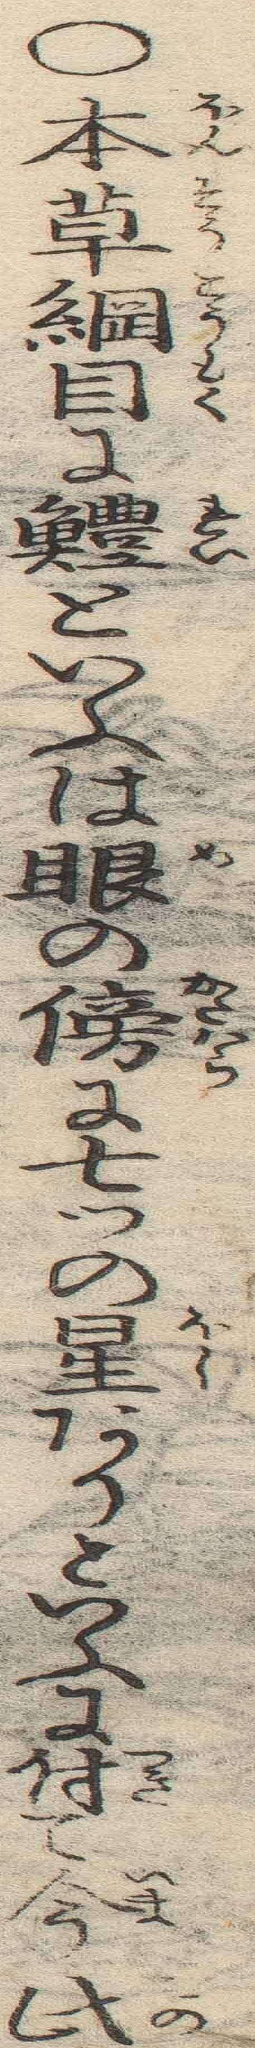○本草綱目に鱧といふは眼の傍に七つの星ありといふに付て今此
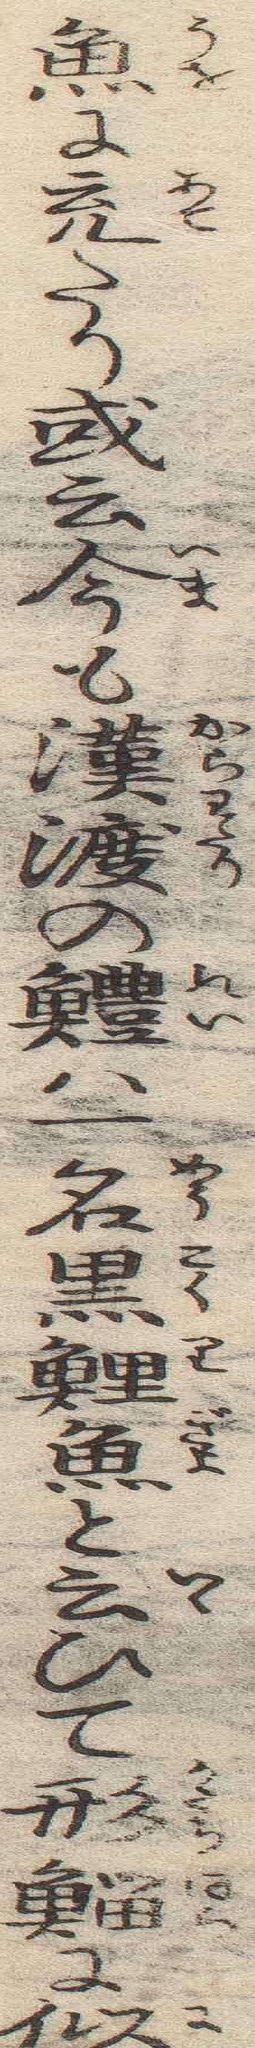魚に充たり或云今も漢渡の鱧は一名黒鯉魚と云ひて形鯔に似
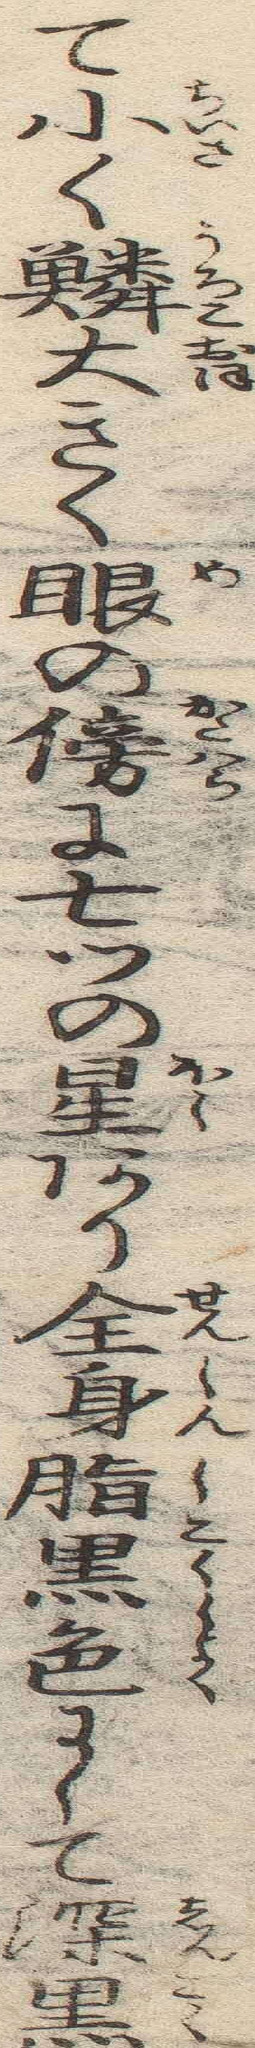て小く鱗大きく眼の傍に七つの星あり全身脂黒色にして深黒
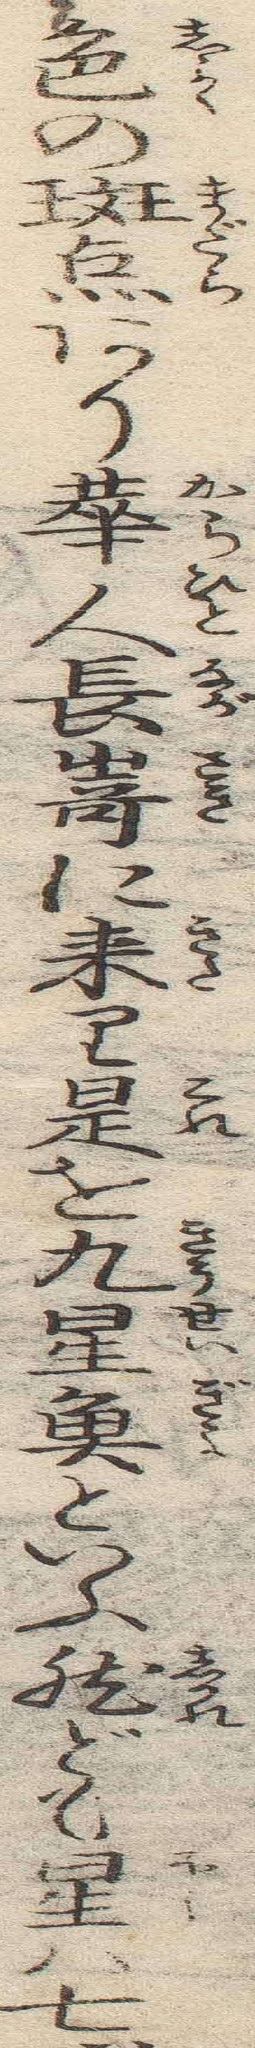色の斑点あり華人長崎に来り是を九星魚といふ然ども星は七つ
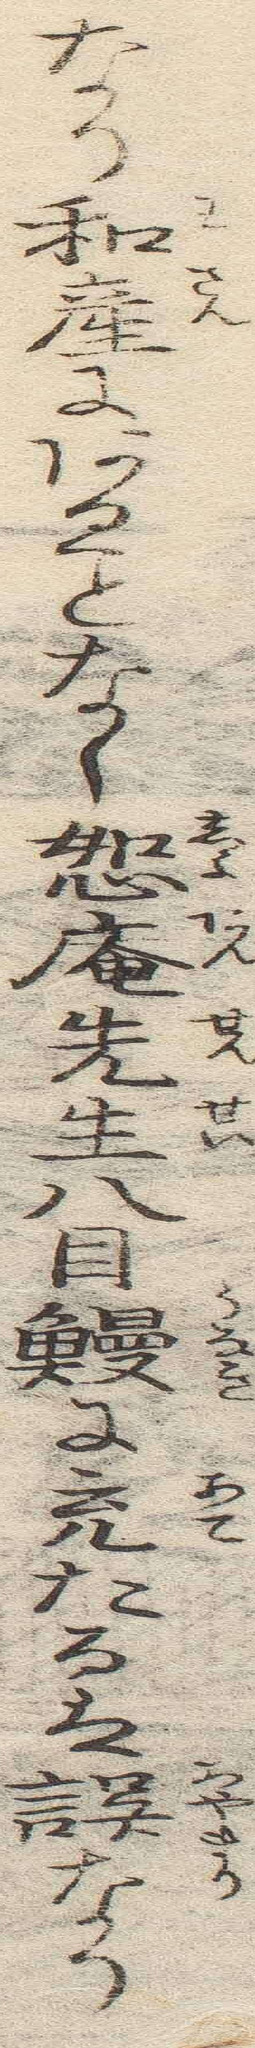なり和産にあることなし恕庵先生八目鰻に充たるは誤なり
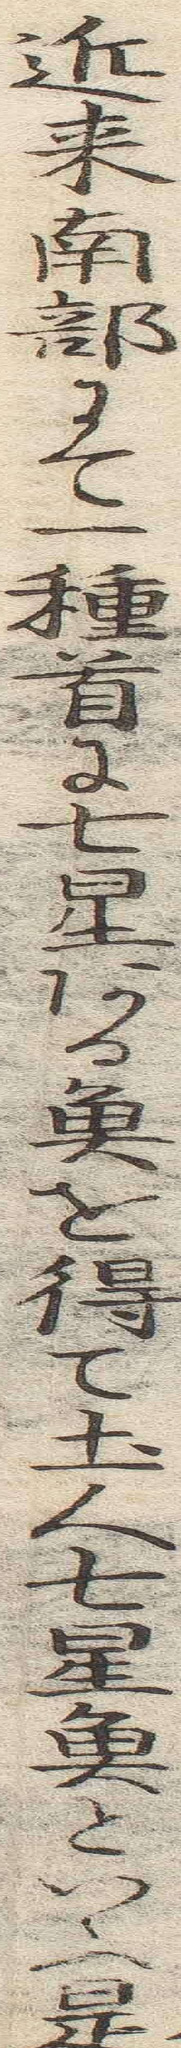近来南部にて一種首に七星ある魚を得て土人七星魚といふ是
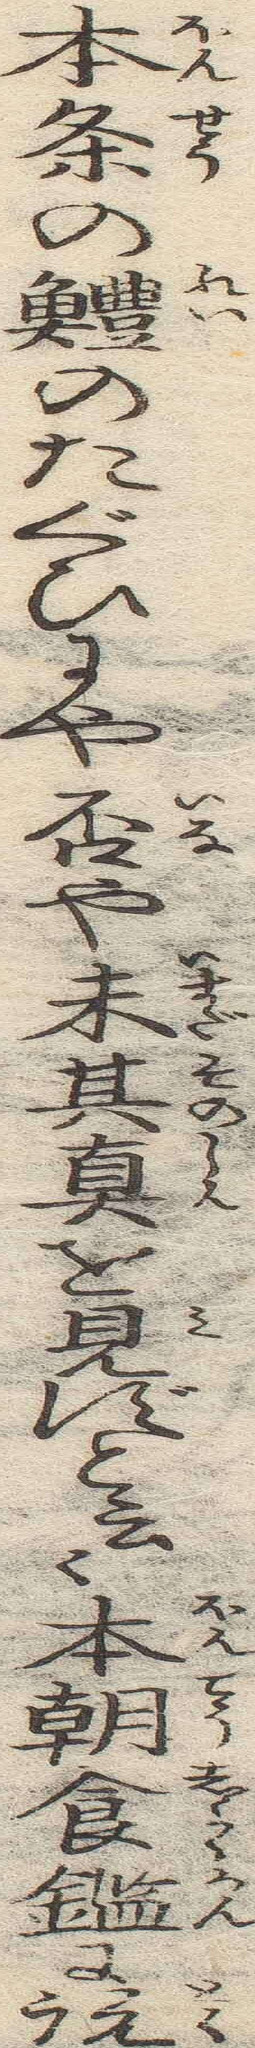本条の鱧のたぐひにや否や未其真を見ずと云々本朝食鑑に説
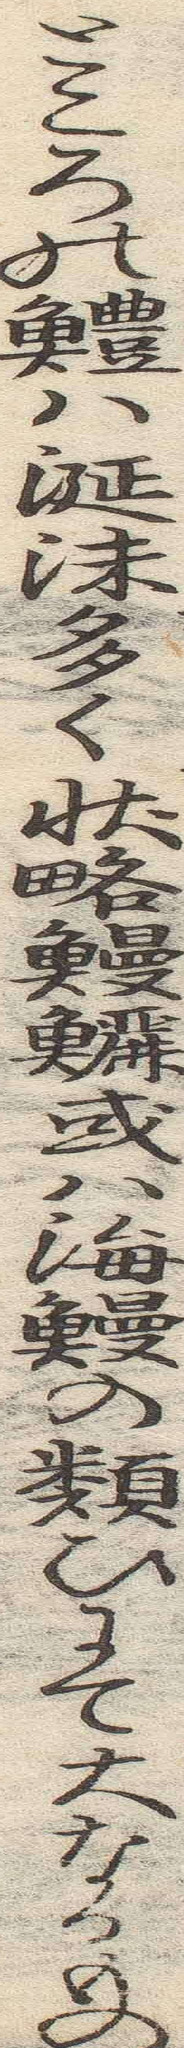ところの鱧は涎沫多く状略鰻鱺或は海鰻の類ひにて大なるもの
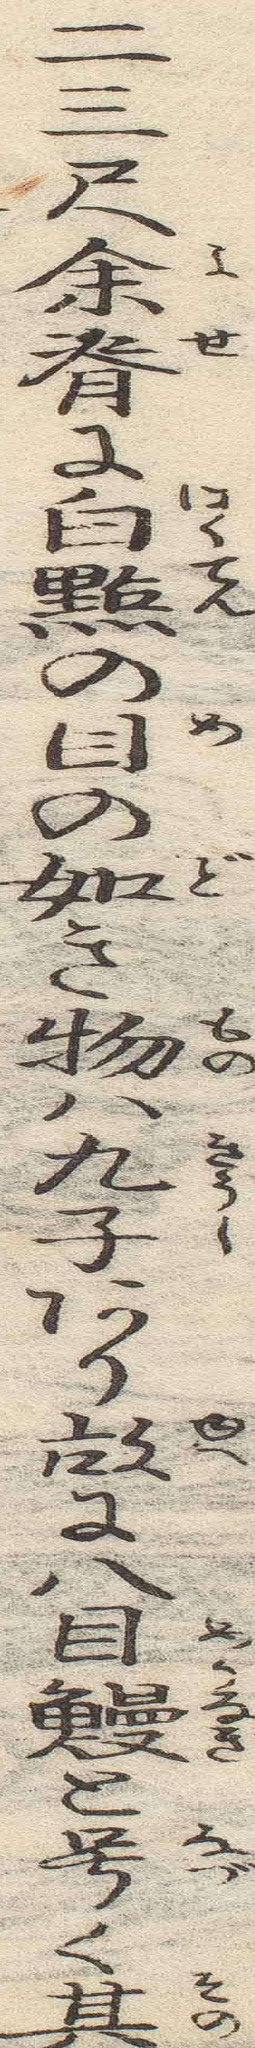二三尺余脊に白点の目の如き物は九子あり故に八目鰻と号く其
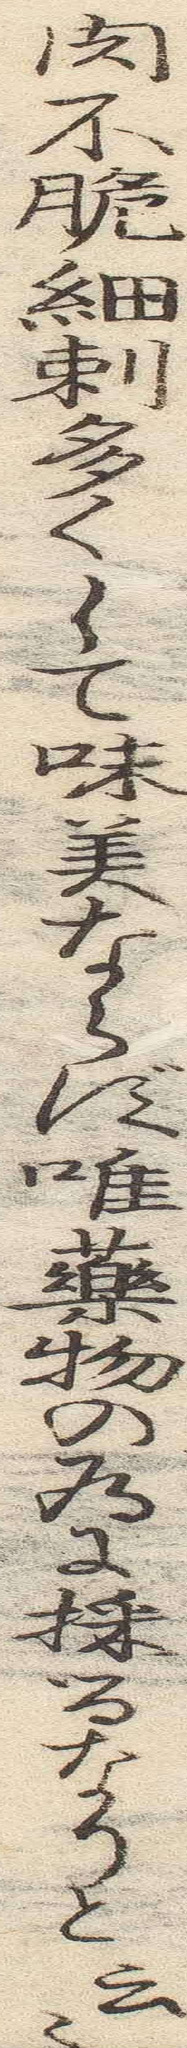肉不脆細刺多くして味美ならず唯薬物の為に採るなりと云々
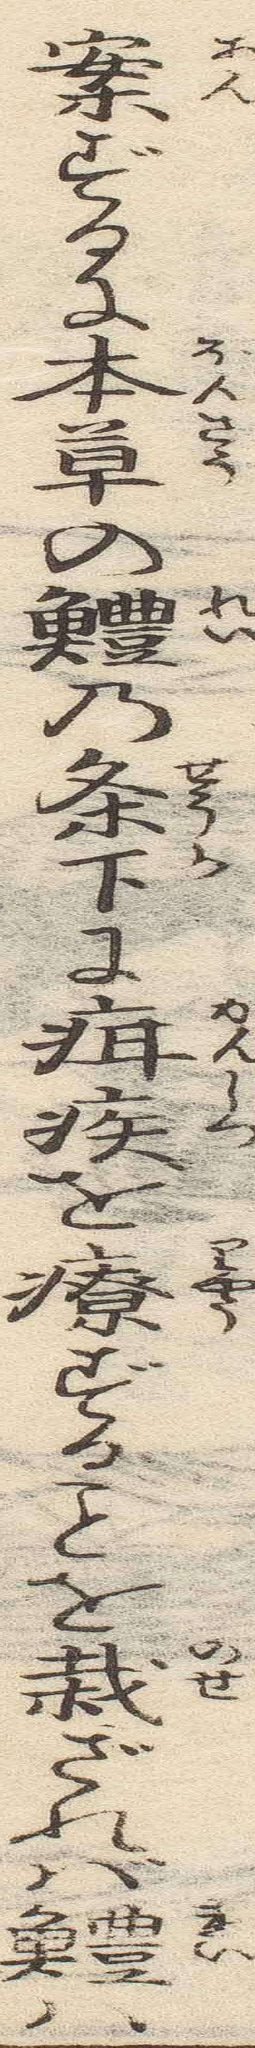案ずるに本草の鱧の条下に疳疾療ずることを栽ざれば鱧は
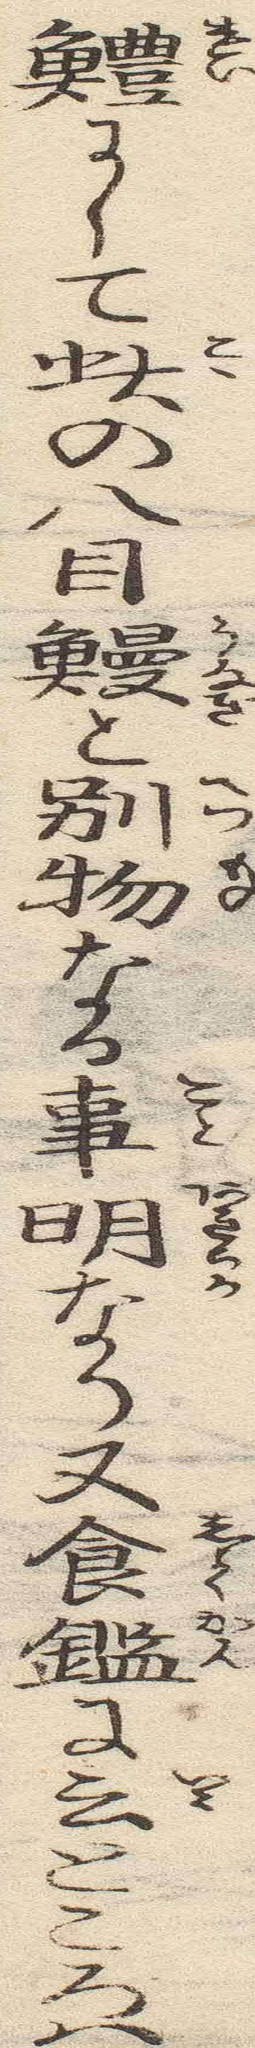鱧にして此の八目鰻と別物なる事明なり又食鑑に云ところは
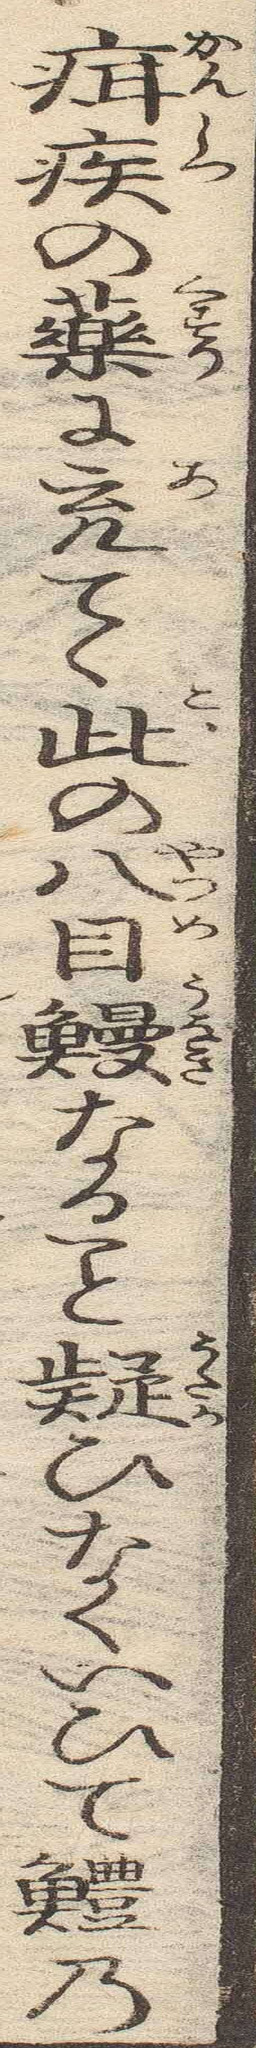疳疾の薬に充てゝ此の八目鰻なること疑ひなくいひて鱧の
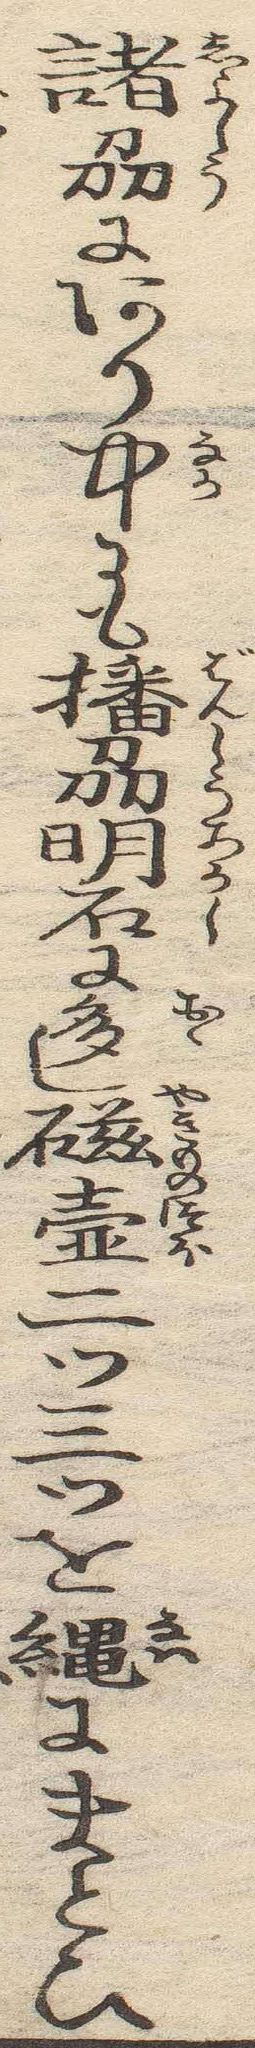諸州にあり中にも播州明石に多し磁壺二ツ三ツを縄にまとひ
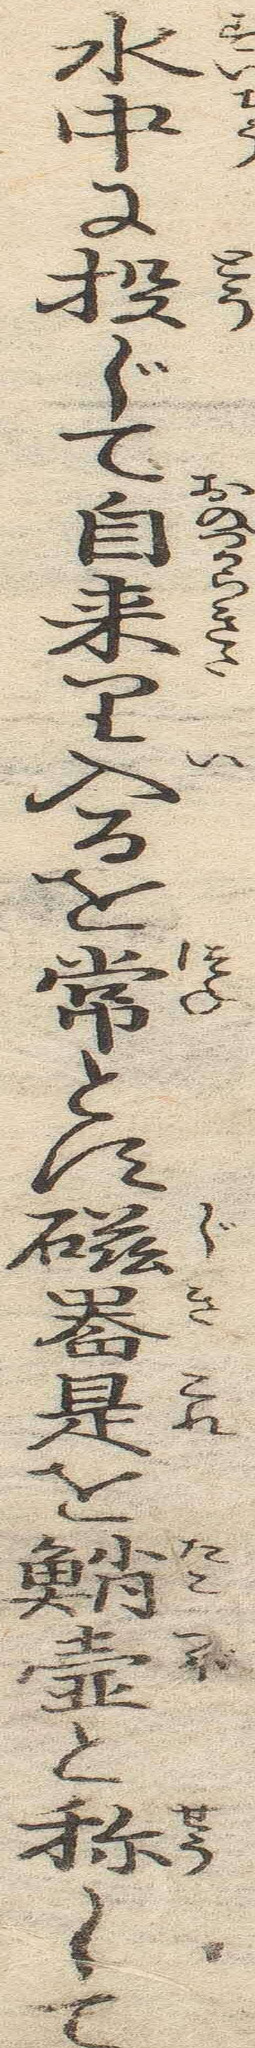水中に投じて自来り入るを常とす磁器是を鮹壺と称して
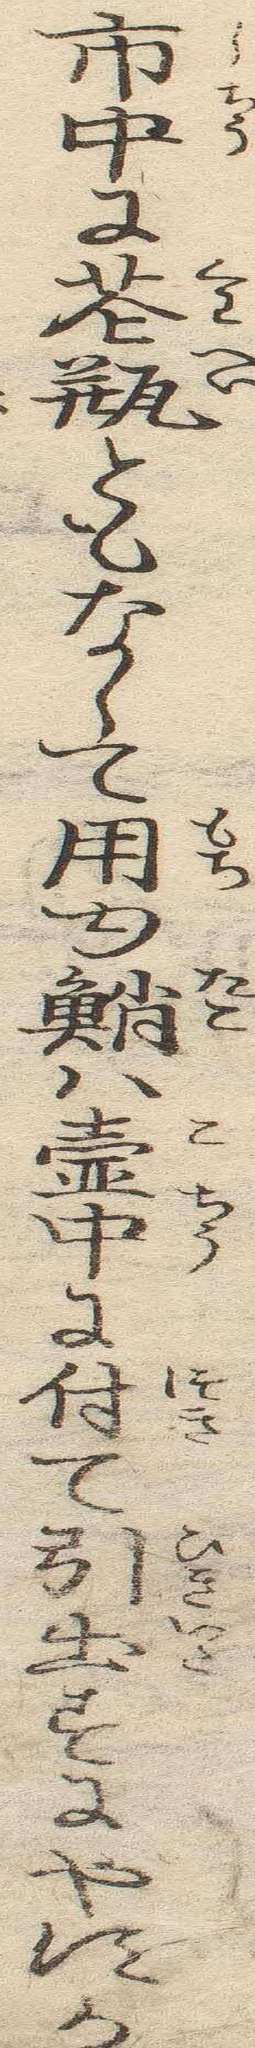市中に花瓶ともなして用ゆ鮹は壺中に付て引出すにやすか
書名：日本山海名産図会
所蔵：東京学芸大学附属図書館 国文学研究資料館
